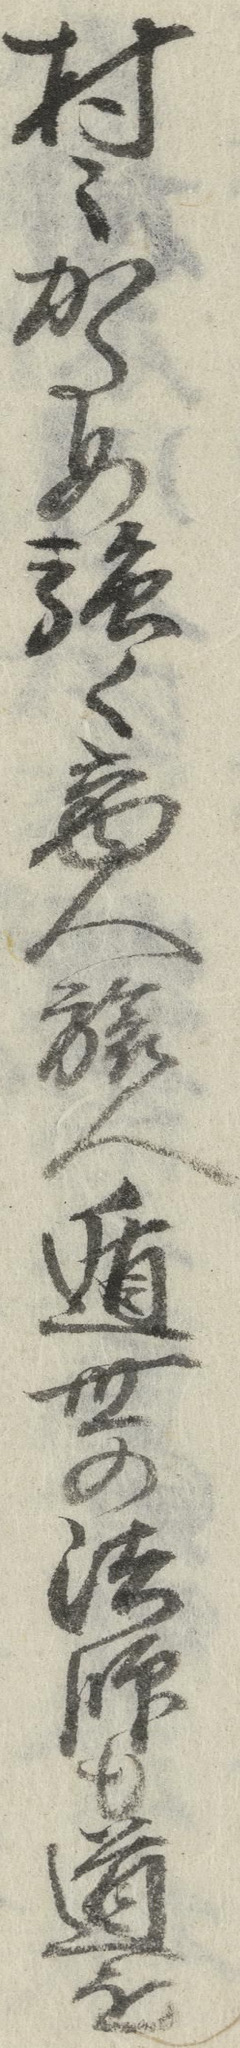村々かため強く商人旅人遁世の法師も道を
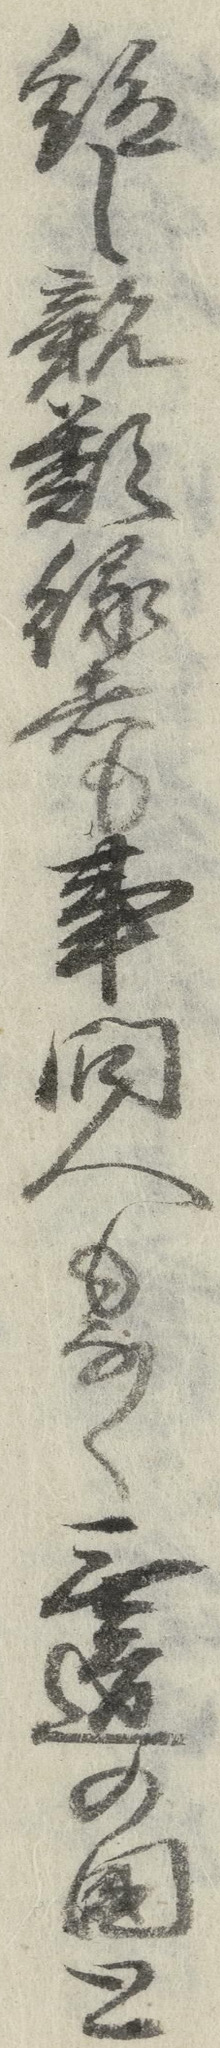絡し親類縁者も事問人もなく無道の国と
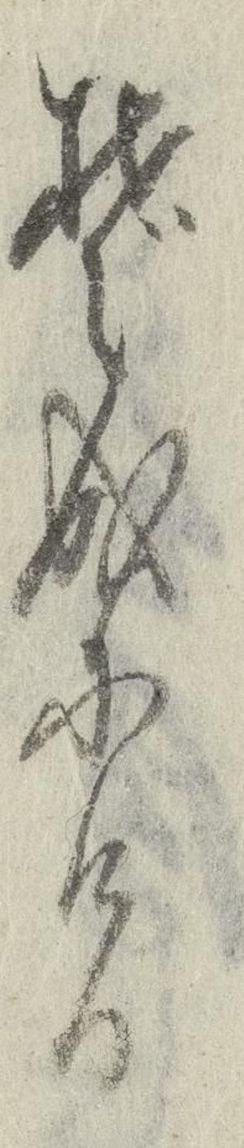ぞ成にける
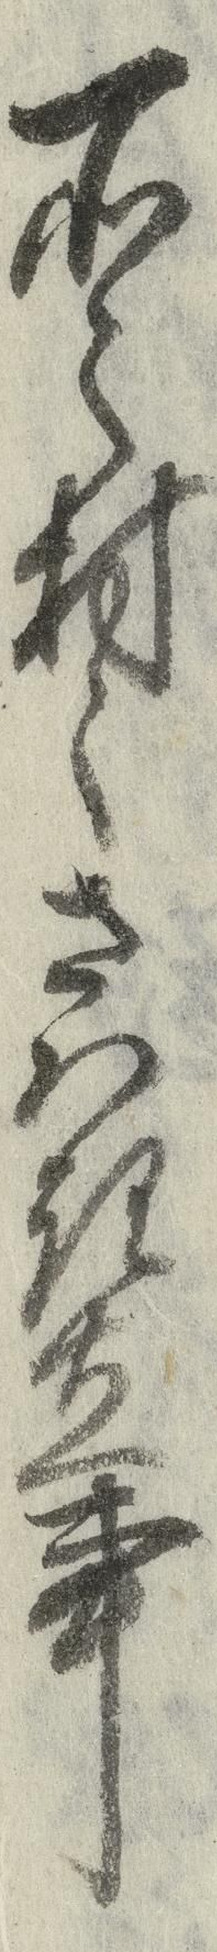所々村々さはき立事
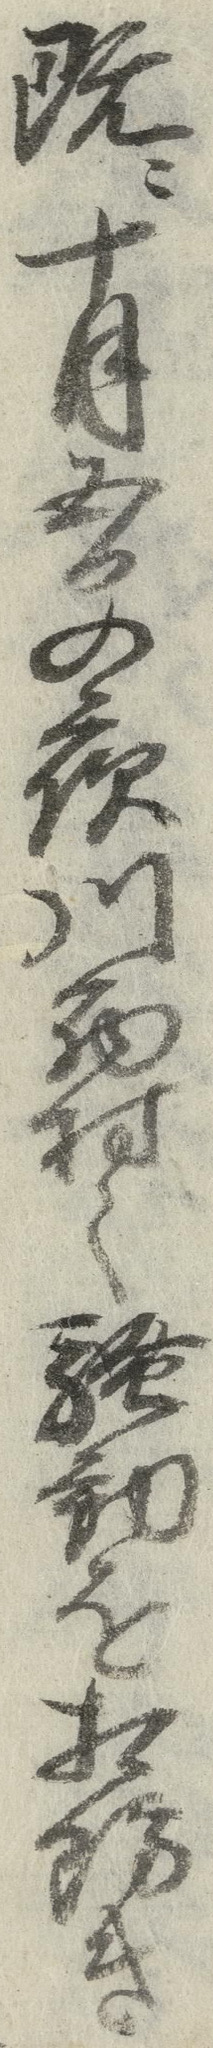既に十月五日の夜川西村之騒動を相防き
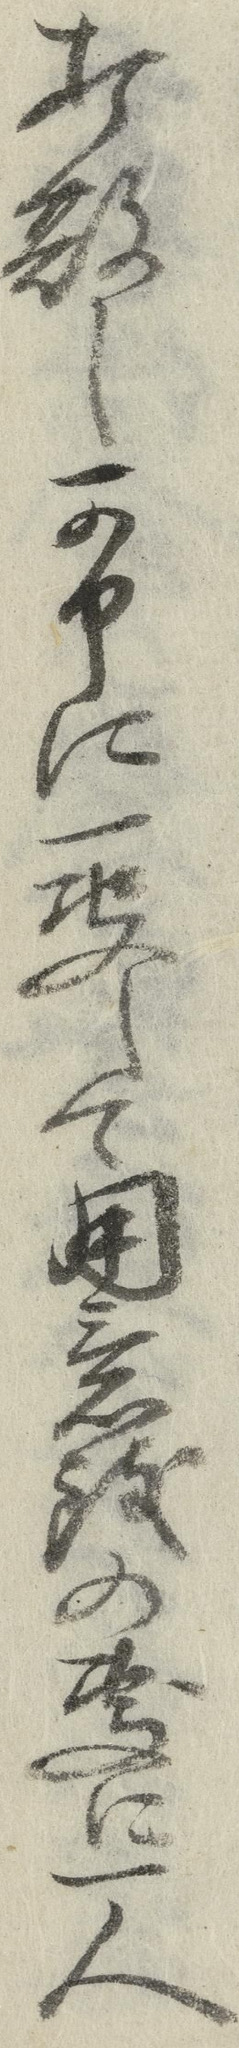相散し可申に一決して用意致の処に一人

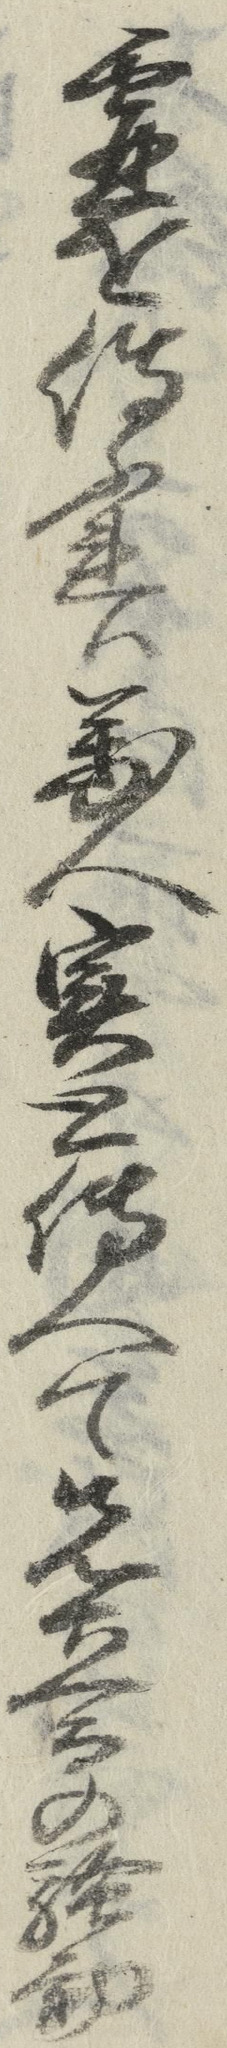虚を傳ふれは万人実と傳へて先立而の騒動
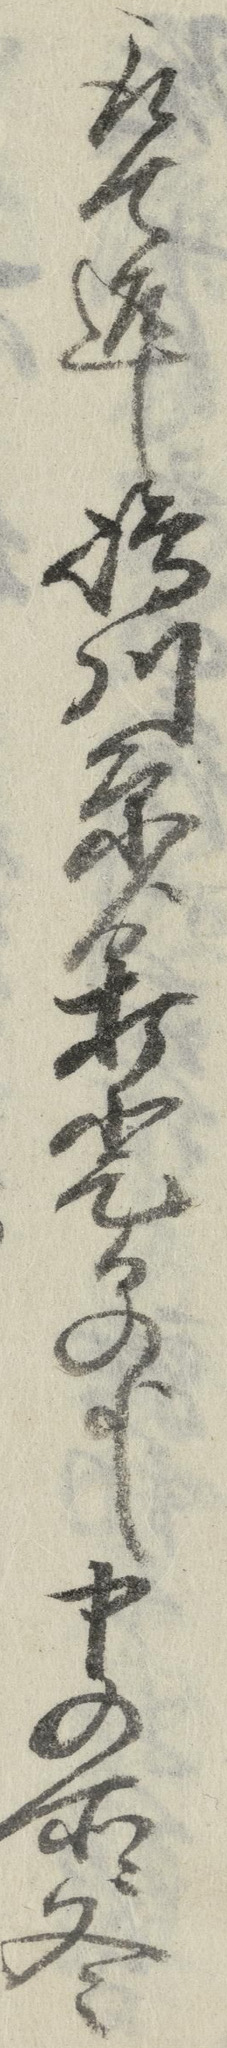取て返し嶋川原ゟ打登るのよし申の所に又々
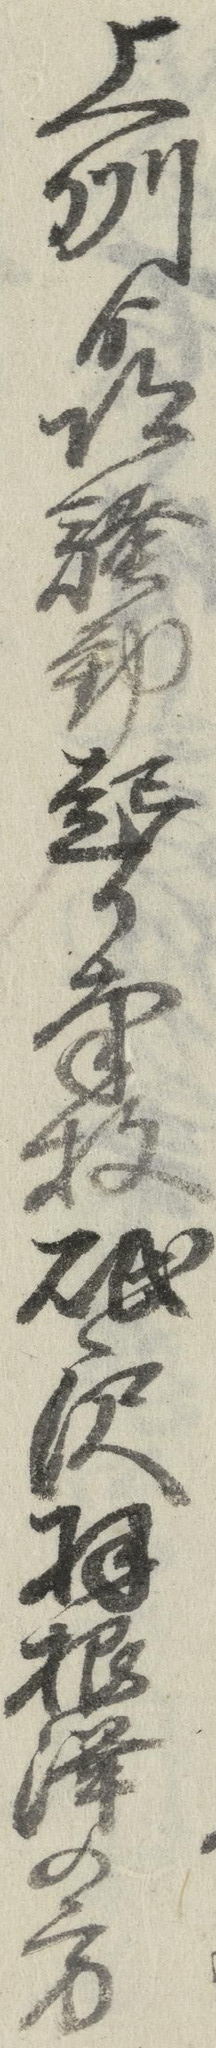上州ゟ跡騒動起り南牧砥沢羽根澤の方
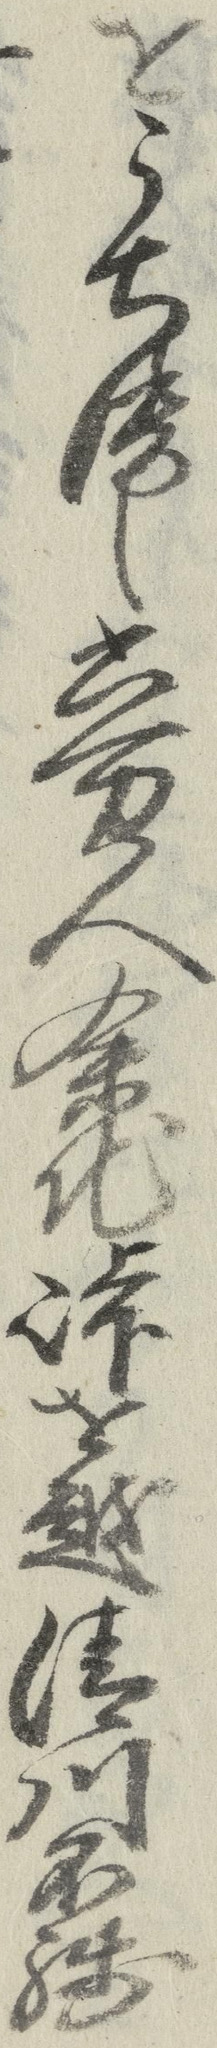をうち潰し六万人余地峠を越清川不残
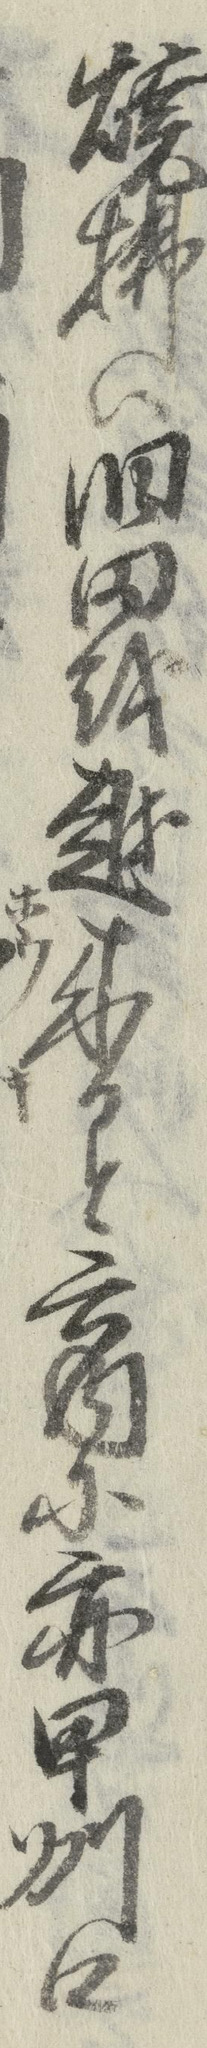焼拂い旧田を越来ると云内に亦甲州口
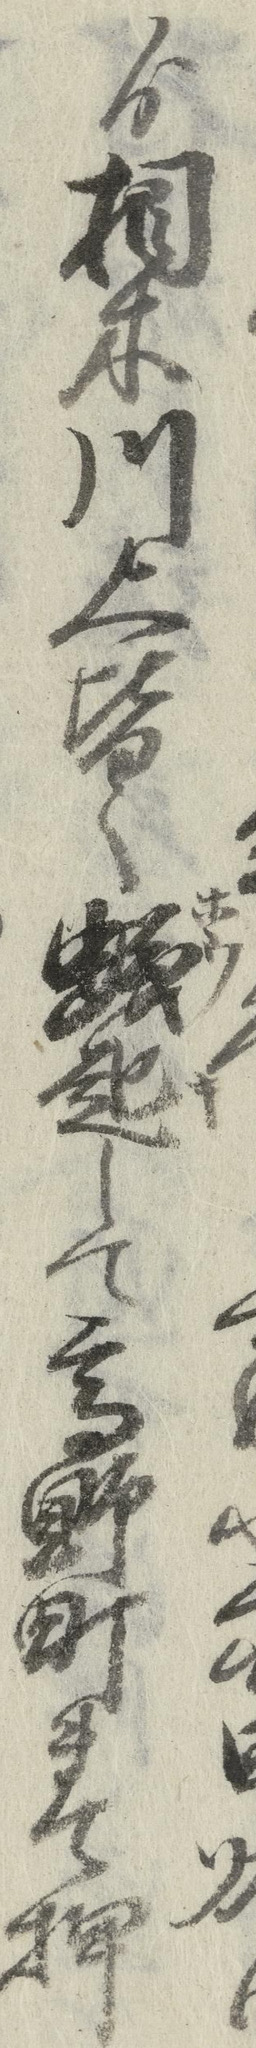ゟ相木川上皆々蜂起して高野町まて押
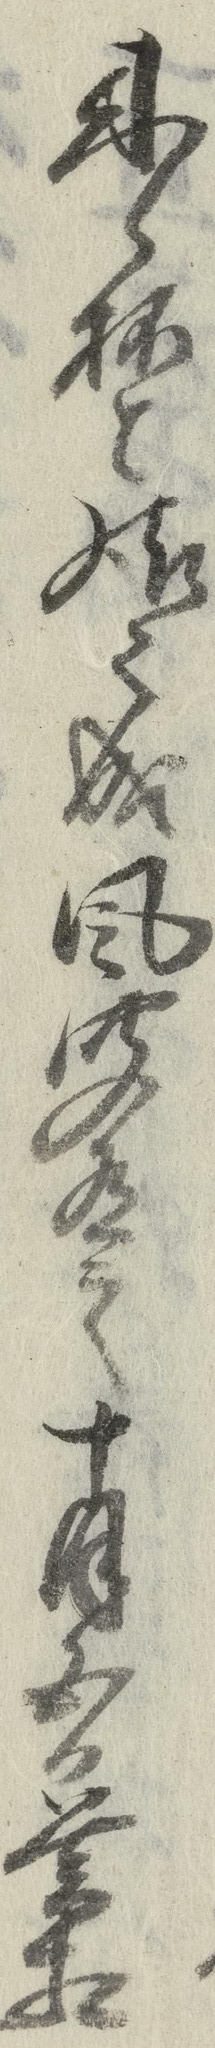来候抔と様々成風聞有て十月五日暮相
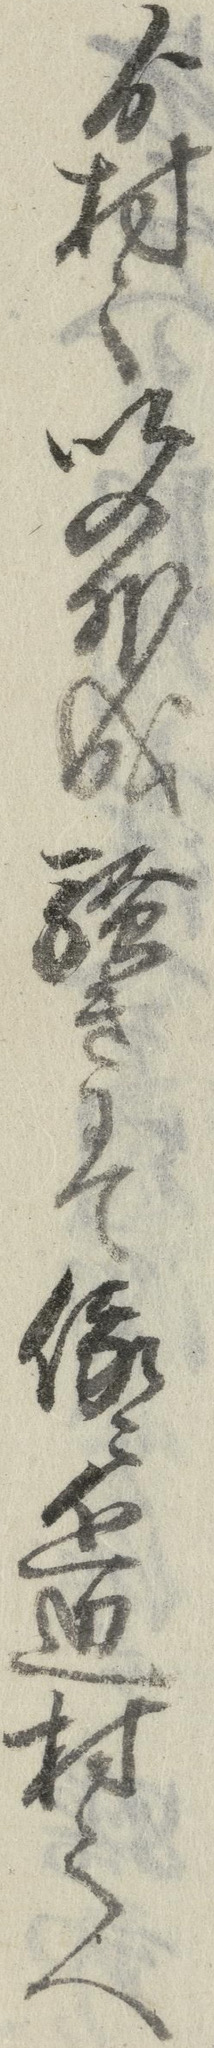ゟ村々以の外成騒きにて俄に近辺村々へ
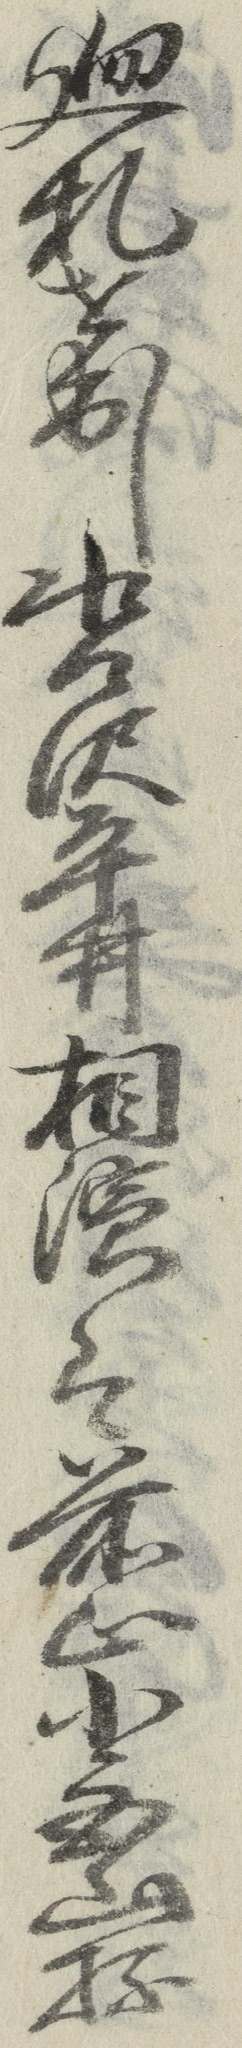廻札を出し沓沢平井相浜は前止小宮山抔
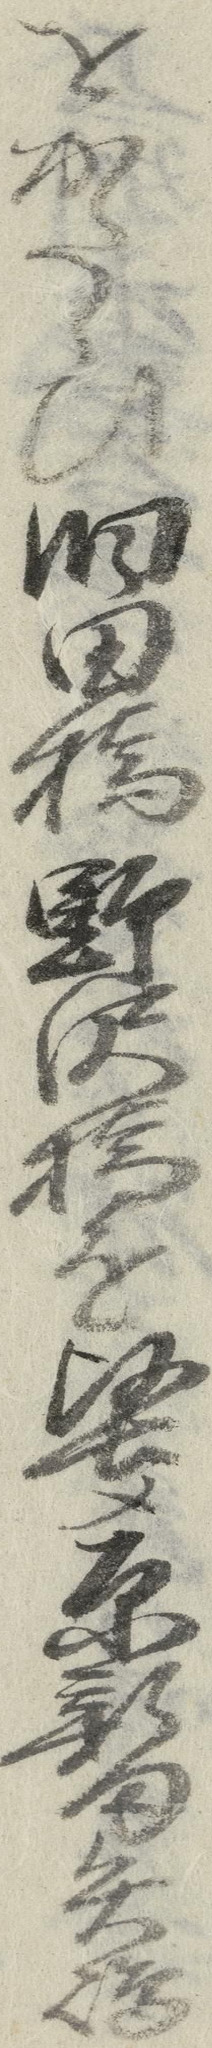をかたらひ旧田橋野沢橋を堅メ原新田矢嶋
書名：浅間大焼騒動記　下
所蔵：東京大学地震研究所図書室 Earthquake Research Institute Library, The University of Tokyo, JAPAN
